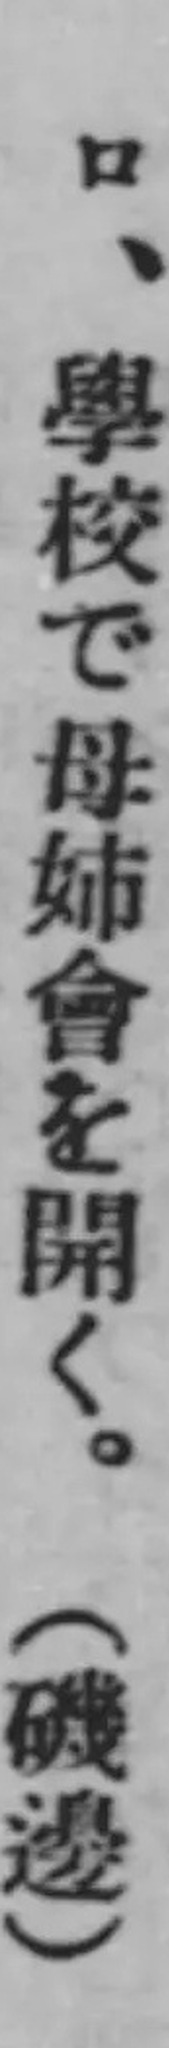ロ、樂校で母姉會を開く。(磯邊)
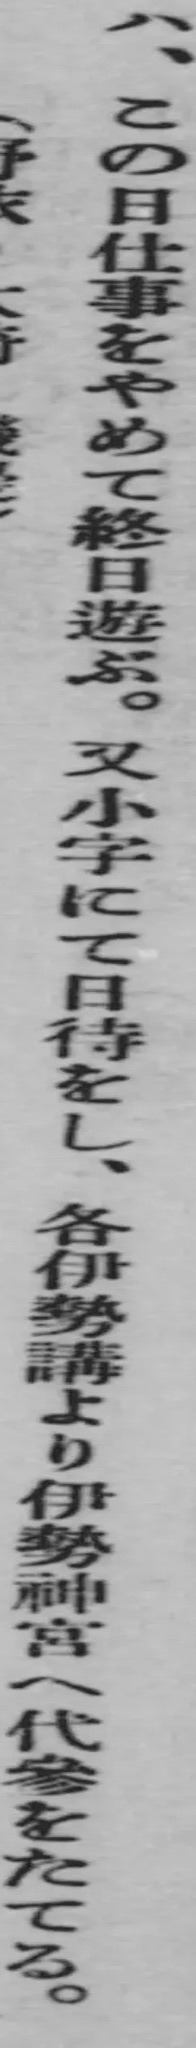ハ、この日仕事をやめて終日遊ぶ。又小字にて日待をし、各伊勢講より伊勢神宮へ代參をたてる。
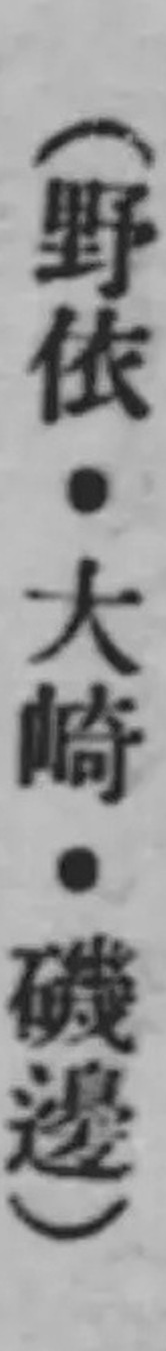(野依・大崎・磯邊)
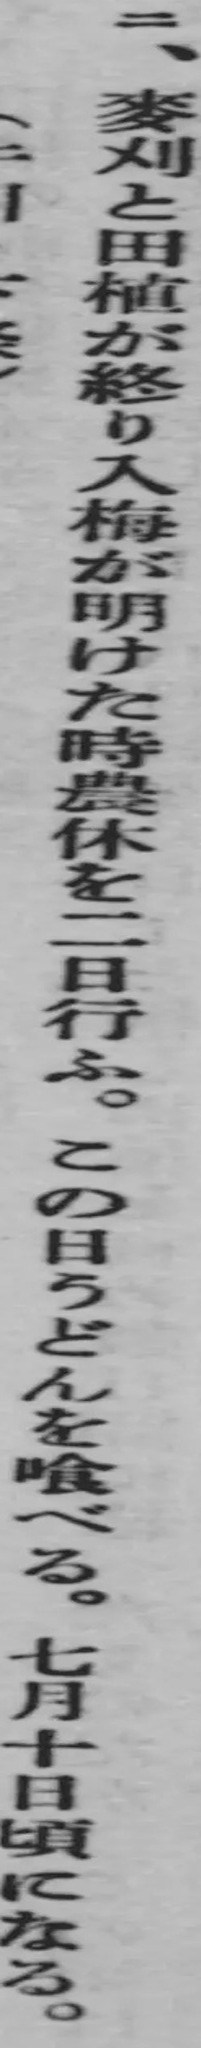ニ、麥刈と田植が終り入梅が明けた時農休を二日行ふ。この日うどんを喰べる。七月十日頃になる。
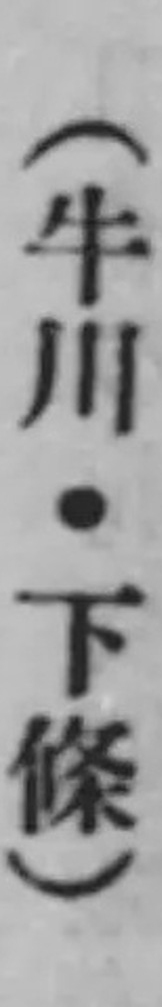(牛川・下條)
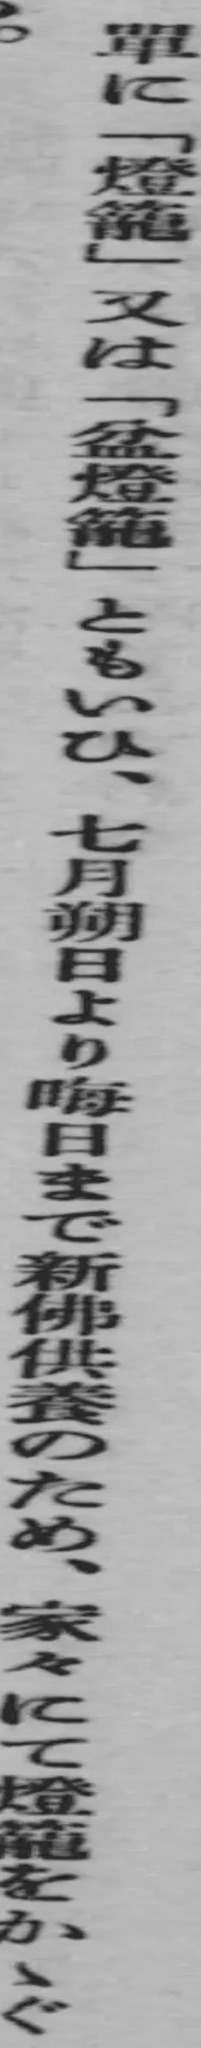單に「燈籠」又は「盆燈籠」ともいひ、七月朔日より晦日まで新佛供養のため、家々にて燈籠をかゝぐ
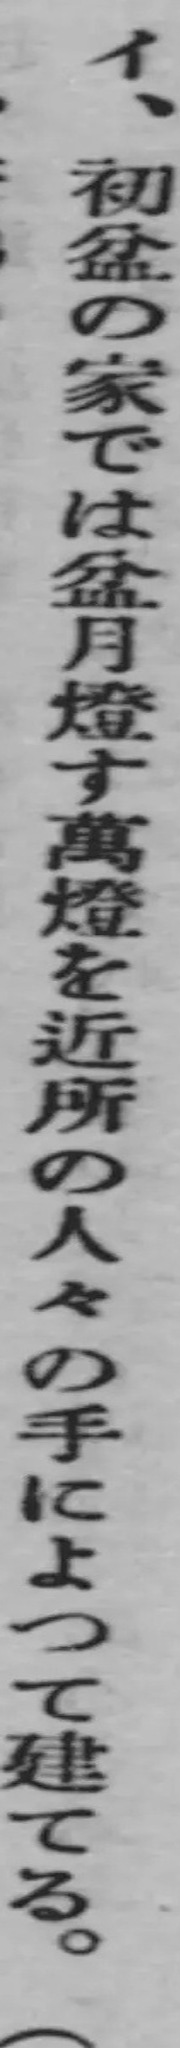イ、初盆の家では盆月燈す萬燈を近所の人々の手によつて建てる。(福岡・磯邊)
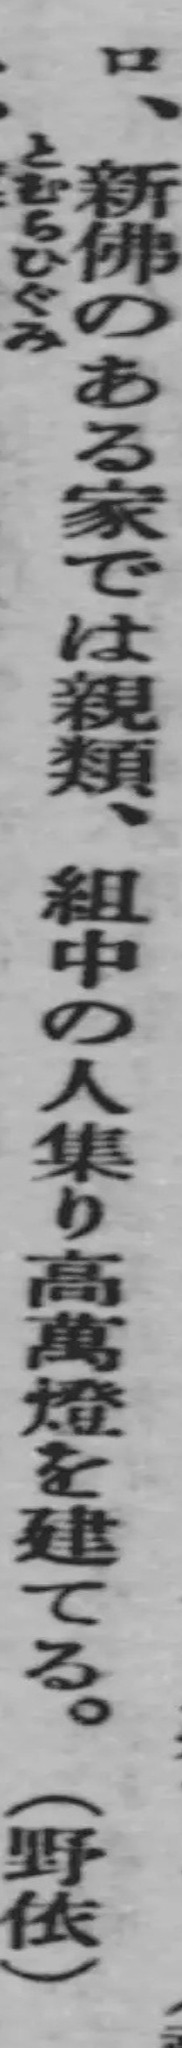ロ、新佛のある家では親類、組中の人集り高萬燈を建てる。(野依)
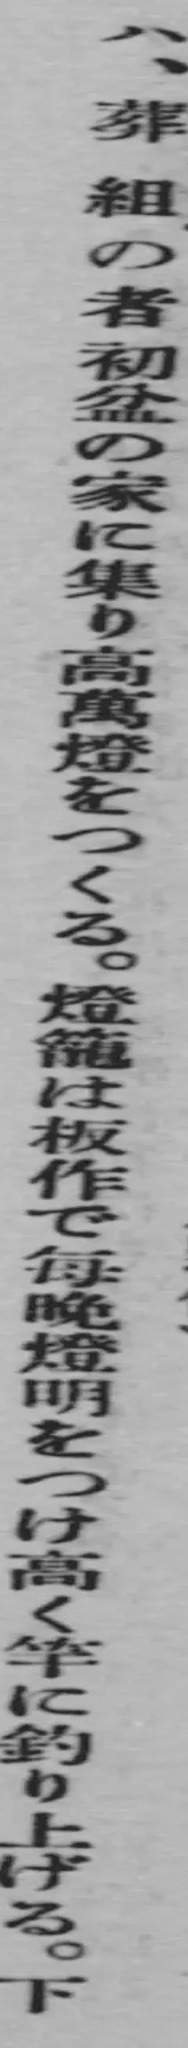ハ、葬組の者初盆の家に集り高萬燈をつくる。燈籠は板作で每晩燈明をつけ高く竿に釣り上げる。下
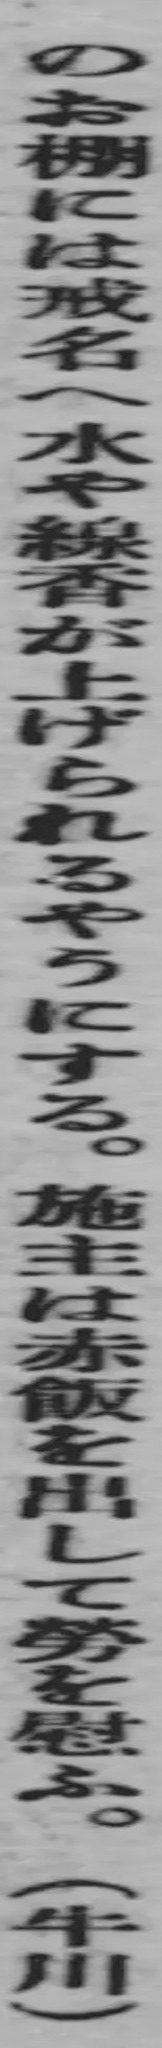のお棚には戒名へ水や線香が上げられるやうにする。施主は赤飯を出して勞を慰ふ。(牛川)
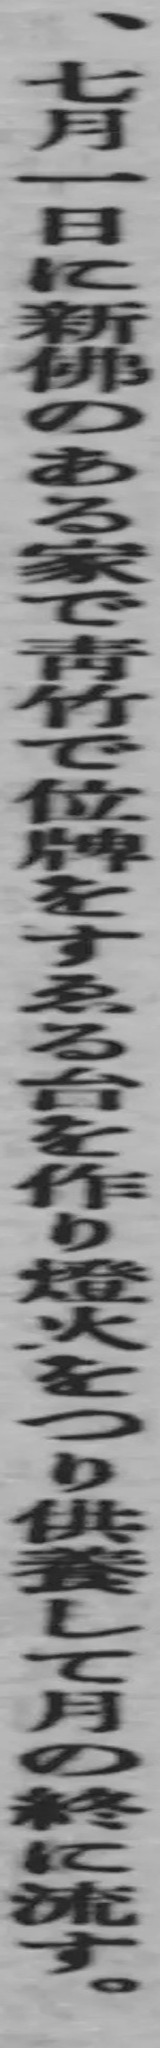ニ、七月一日に新佛のある家で靑竹で位牌をすゑる台を作り燈火をつり供養して月の終に流す。
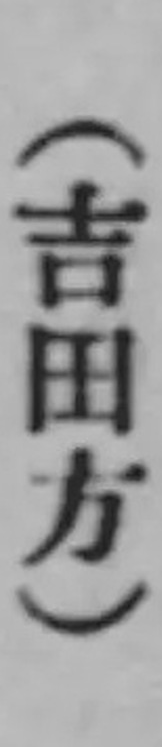(吉田方)
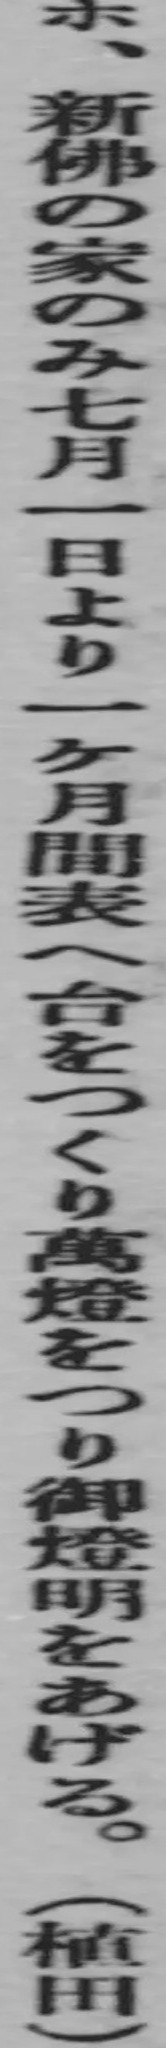ホ、新佛の家のみ七月一日より一ケ月間表へ台をつくり萬燈をつり御燈明をあげる。(植田)
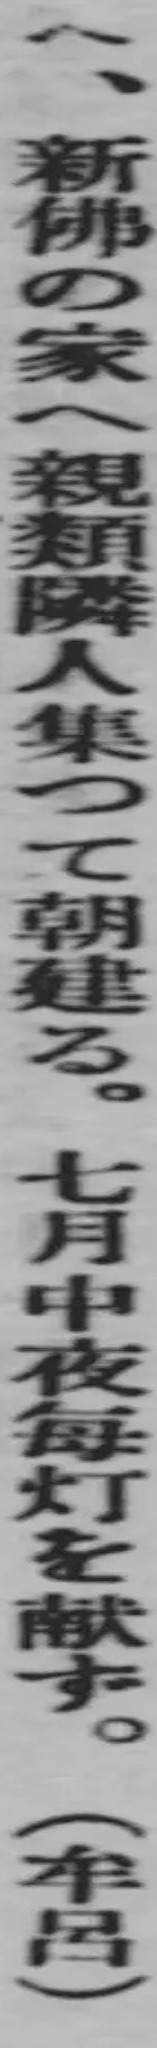ヘ、新佛の家へ親類隣人集つて朝建る。七月中夜每灯を献ず。(牟呂)

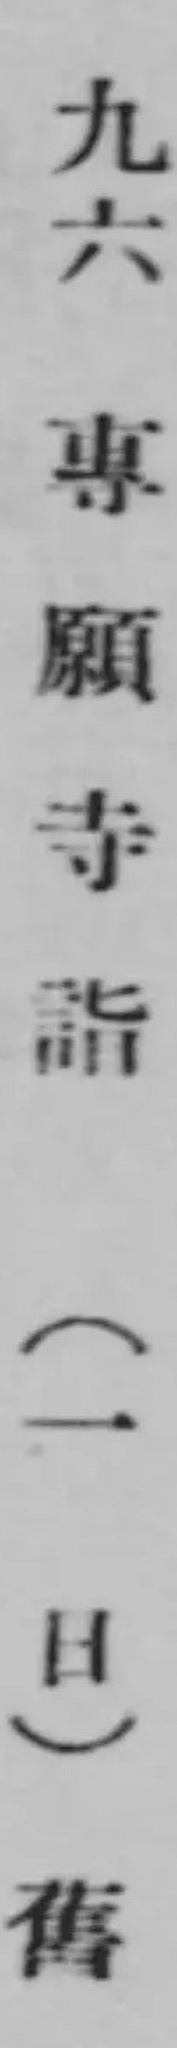九六專願寺詣(一日)舊
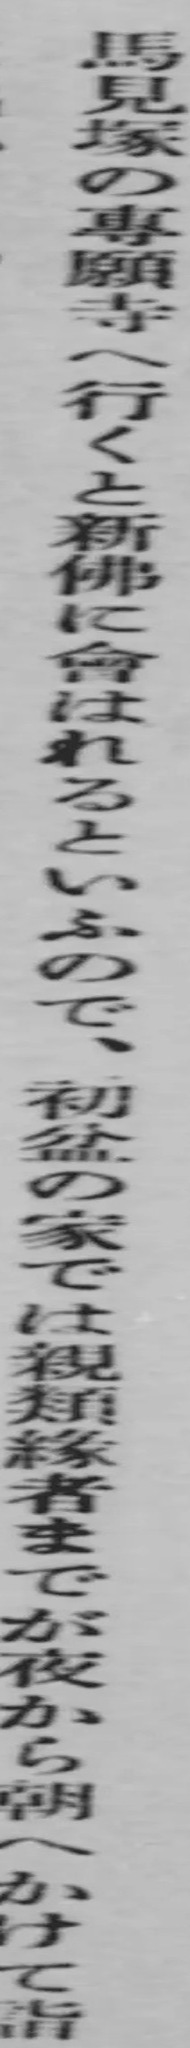馬見塚の專願寺へ行くと新佛に會はれるといふので、初盆の家では親類緣者までが夜から朝へかけて詣
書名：豊橋の年中行事
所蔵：国立国会図書館 National Diet Library, JAPAN
